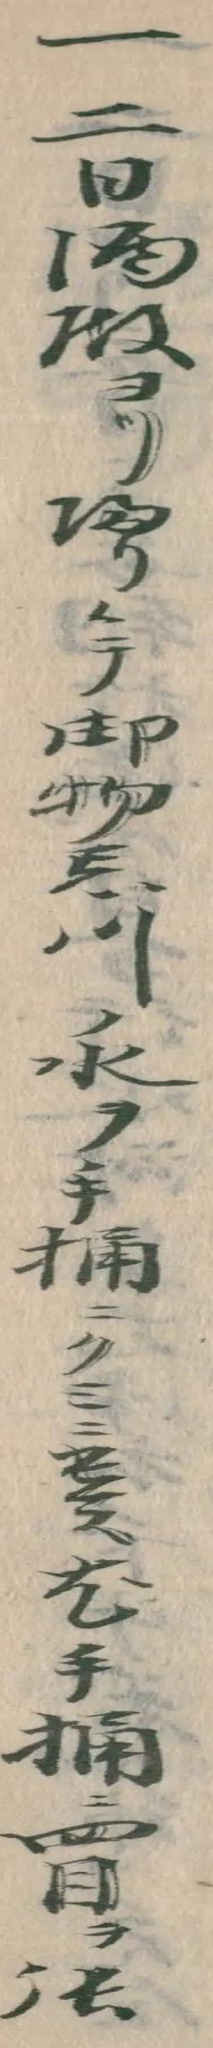一二日酒殿ヨリ帰リ候テ御物忌川ノ水ヲ手桶ニクミニ遣ス尤手桶ニ四目ヲ張
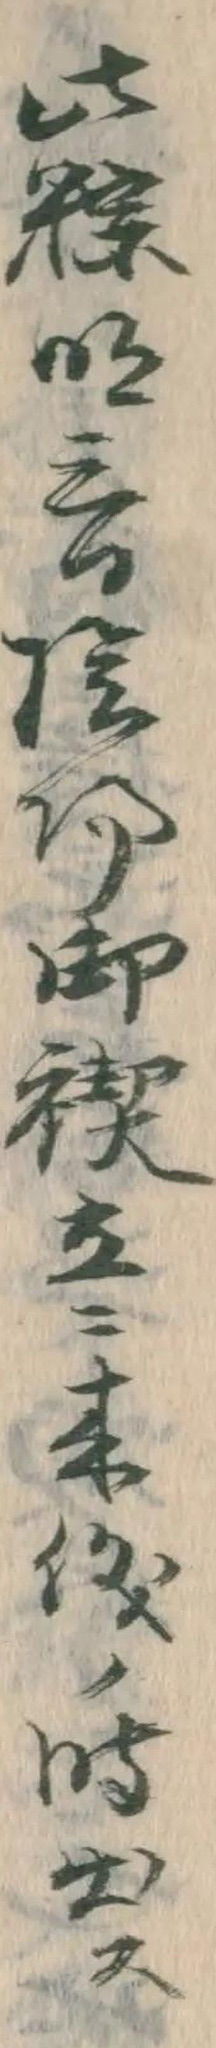此粽明三日陰陽御禊立ニ来儀ノ時出ス
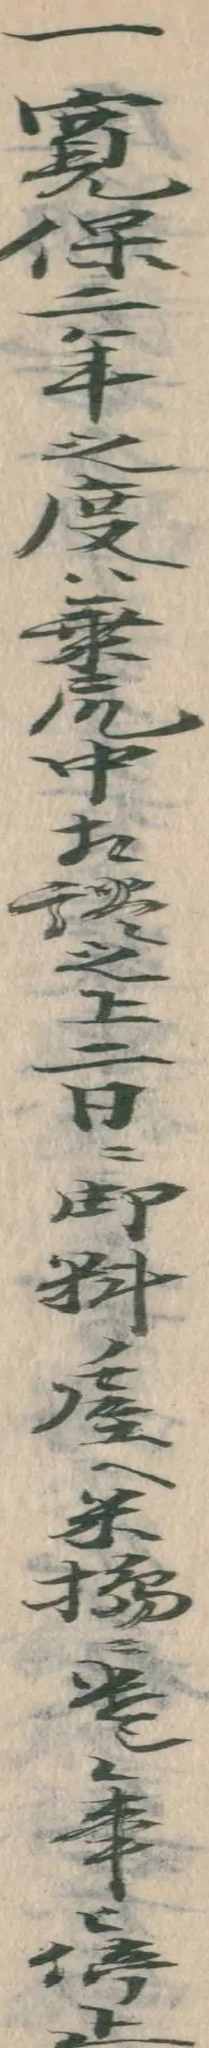一寛保二年之度ハ乗尻中相談之上二日ニ御料ノ屋ヘ米搗ニ遣候事被停止
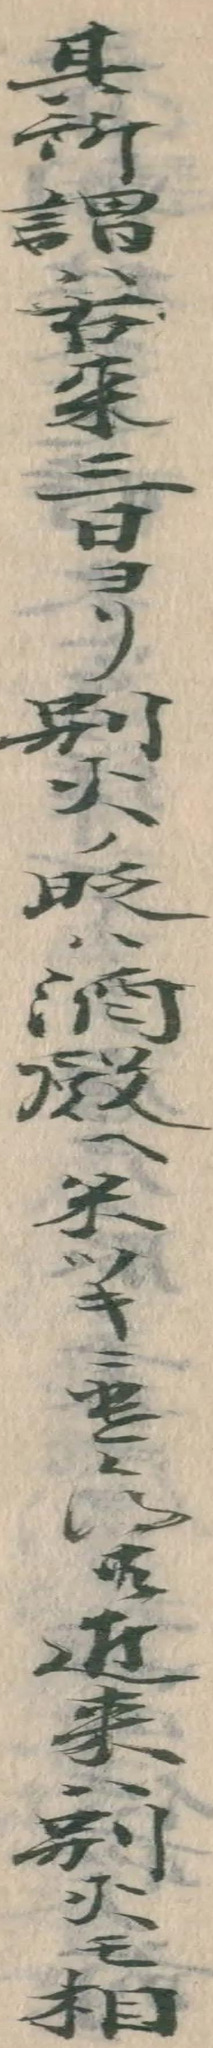其所謂ハ古来三日ヨリ別火ノ時ハ酒殿へ米ツキニ遣候得共近来ハ別火モ相
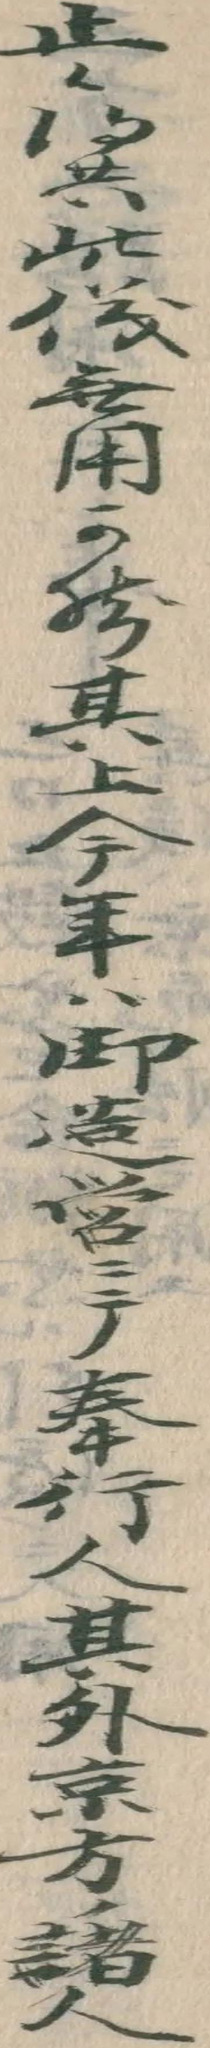止候得共此儀無用可然其上今年ハ御造営ニテ奉行人其外京方ノ諸人
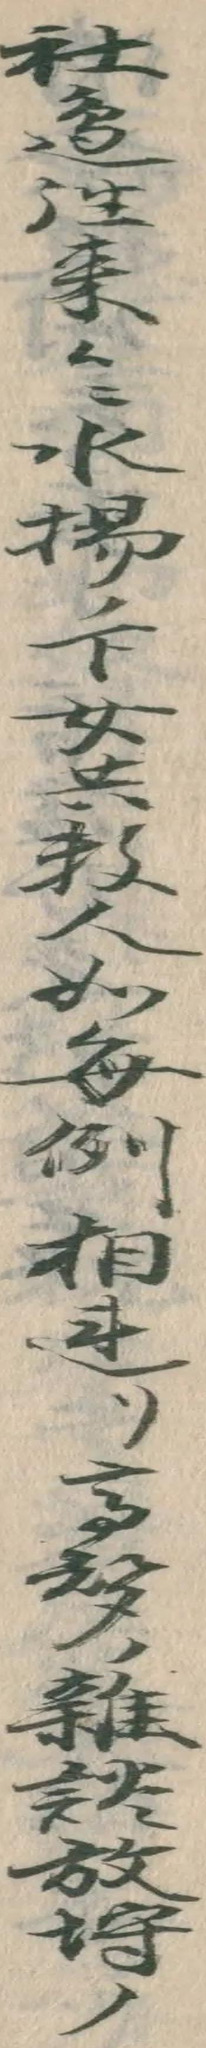社辺往来候ニ水揚ノ下女共数人如毎例相連リ高声ノ雑談放埒ノ
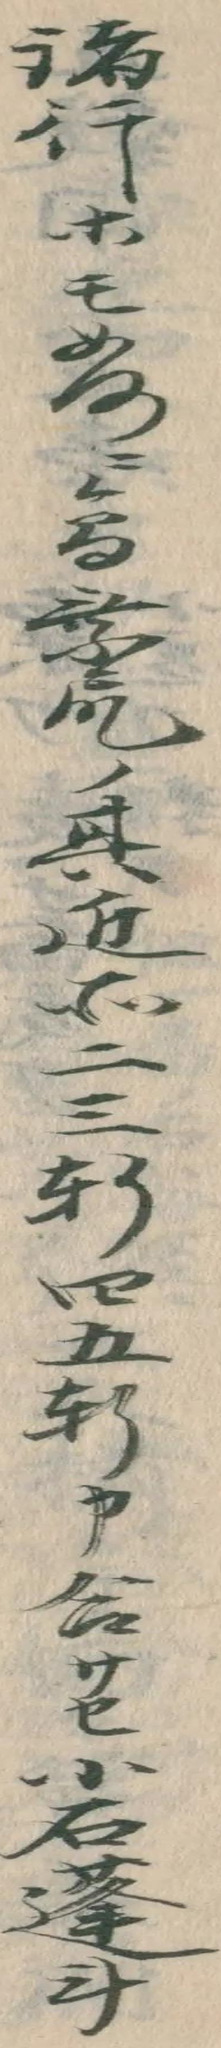諸行等モ如何ニ候間乗尻ノ其近所二三軒四五軒申合サセ小石蓬計
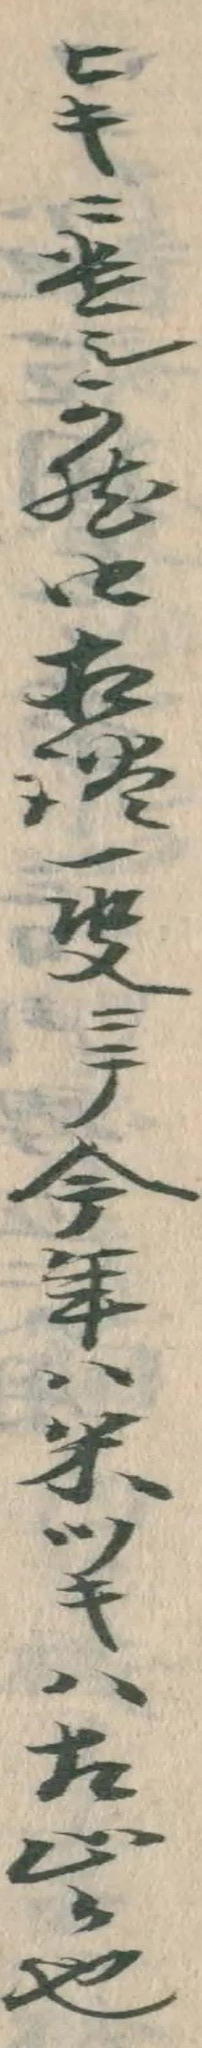ヒキニ遣シ可然由相談一決ニテ今年ハ米ツキハ相止候也

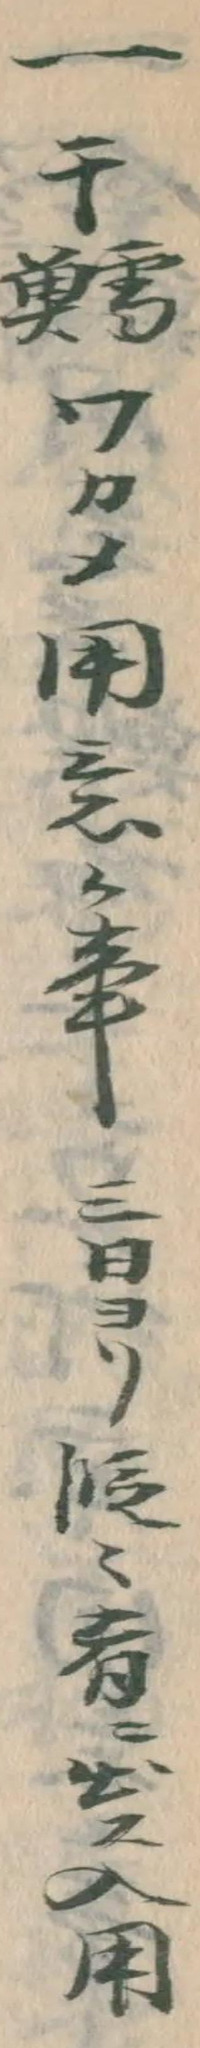一干鱈ワカメ用意候事三日ヨリ段々肴ニ出ス入用
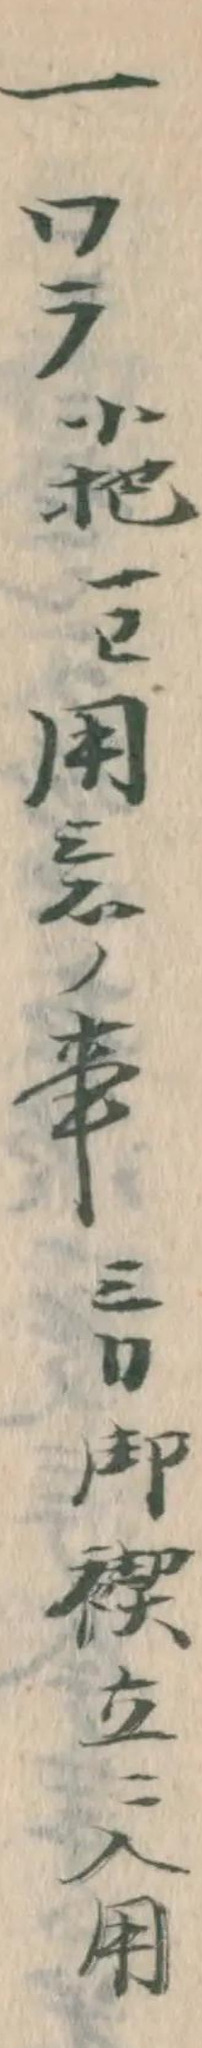一ワラ小把一ワ用意ノ事三日御禊立ニ入用
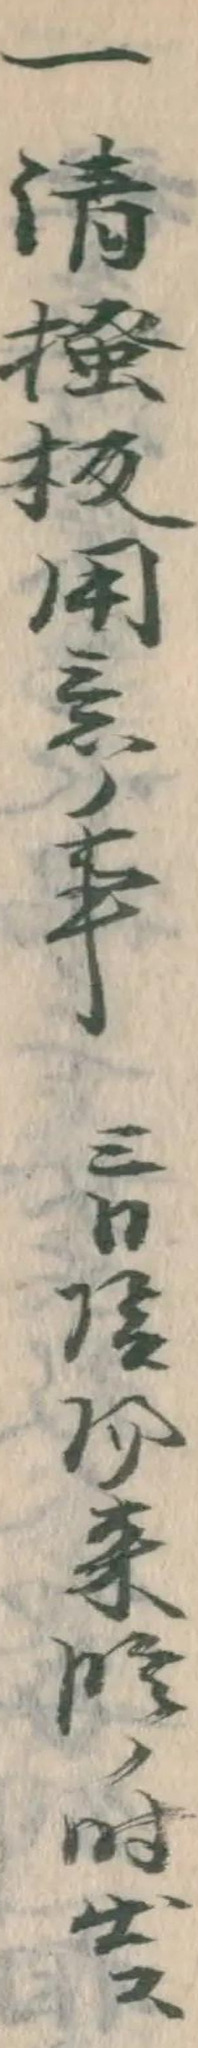一清掻板用意ノ事三日陰陽来臨ノ時出ス
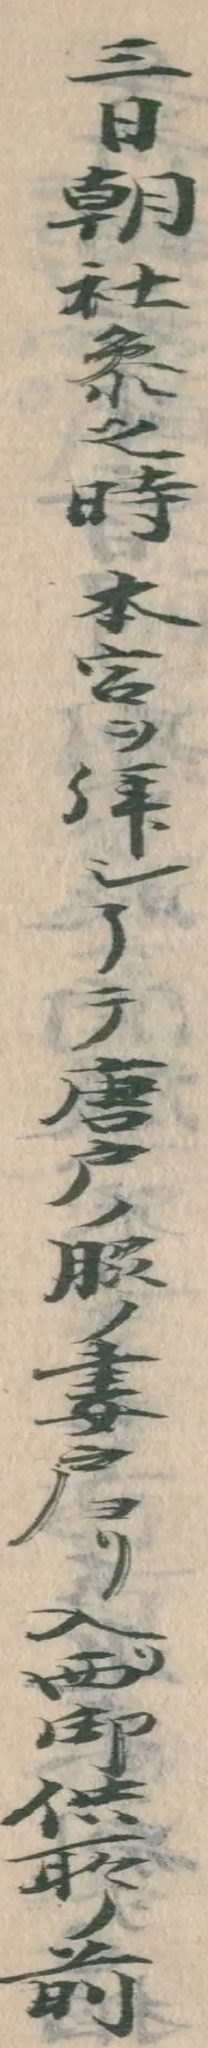一三日朝社参之時本宮ヲ拝シ了テ唐戸ノ脇ノ妻戸ヨリ入リ西御供所ノ前
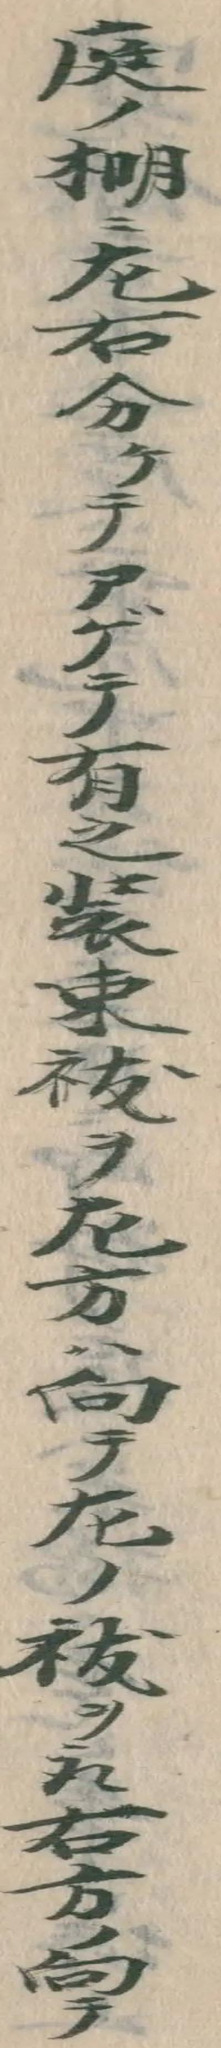庭ノ棚ニ左右分ケテアゲテ有之装束祓ヲ左方ハ向テ左ノ祓ヲ取右方ノ向テ
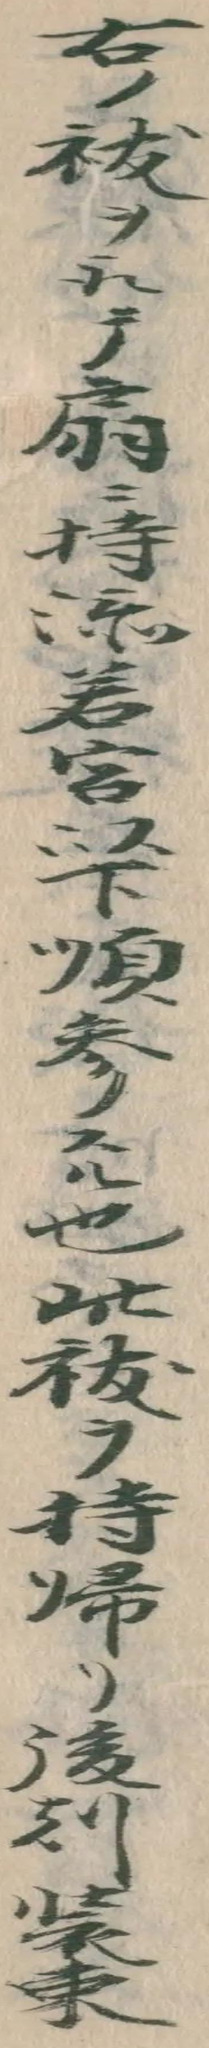右ノ祓ヲ取テ扇ニ持添若宮以下順参スル也此祓ヲ持帰リ後刻装束
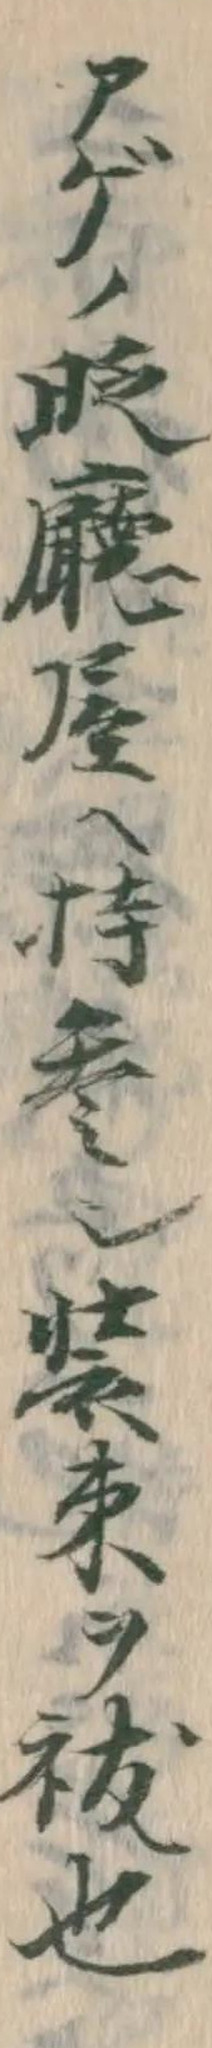アゲノ時庁屋へ持参シ装束ヲ祓也
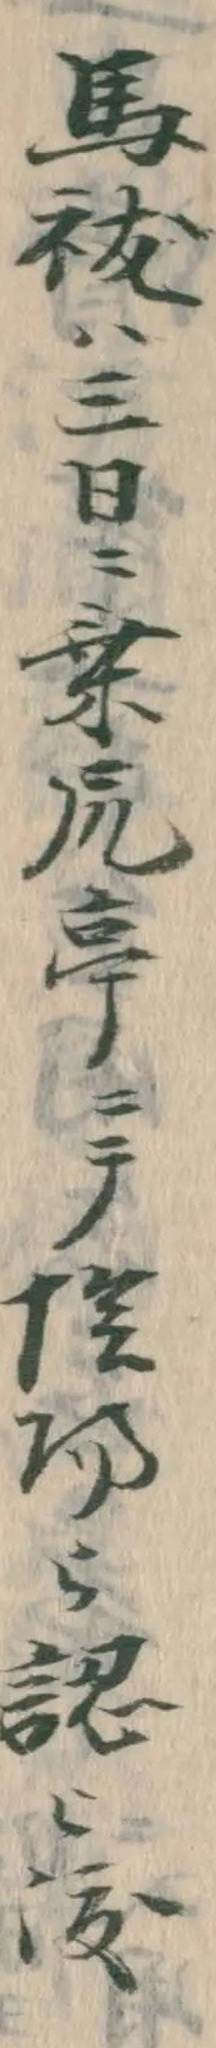馬祓ハ三日ニ乗尻亭ニテ陰陽被認被渡
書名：賀茂社記録. 第11冊
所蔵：国立国会図書館 National Diet Library, JAPAN
